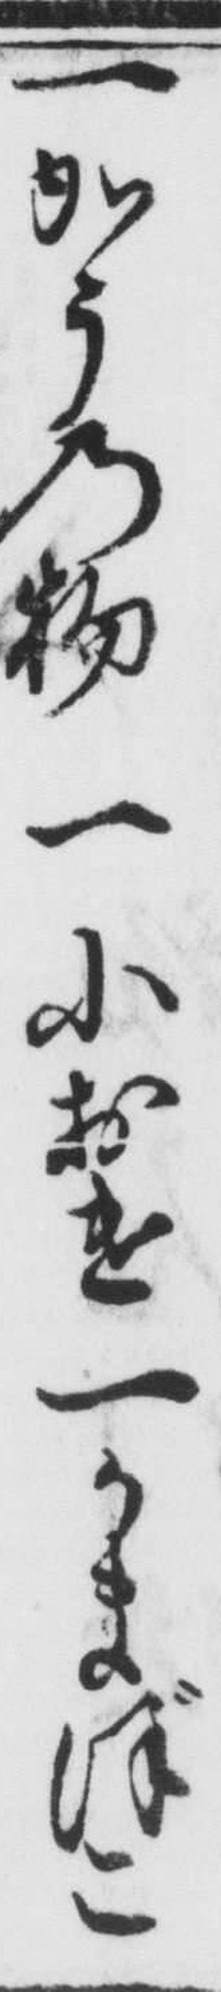一かうの物一小おけ一かまぼこ
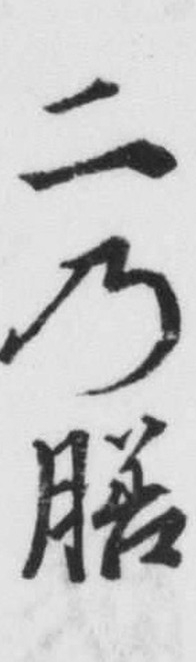二の膳
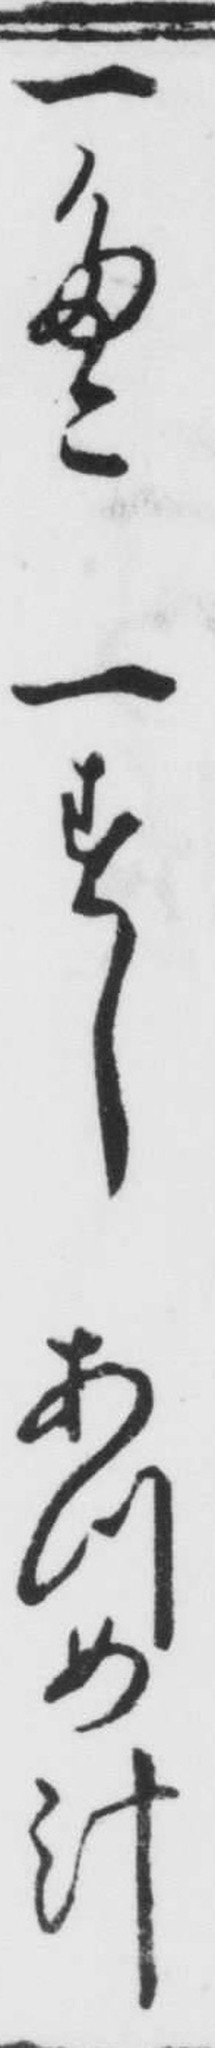一ゆこ一すしあつめ汁
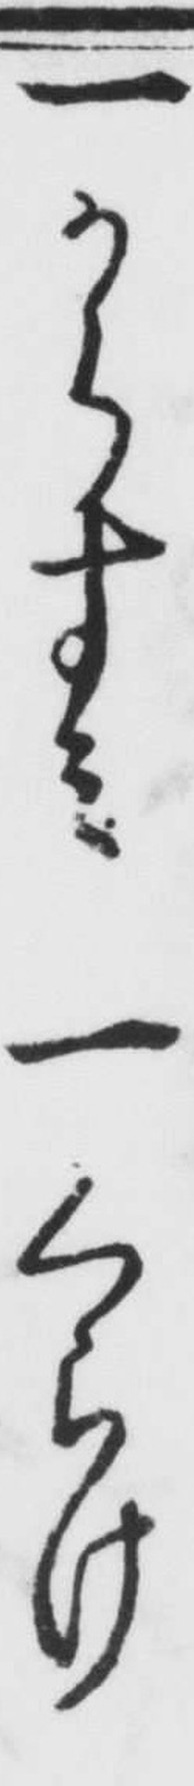一からすミ一くらけ
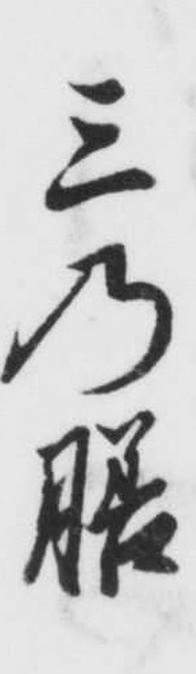三の膳
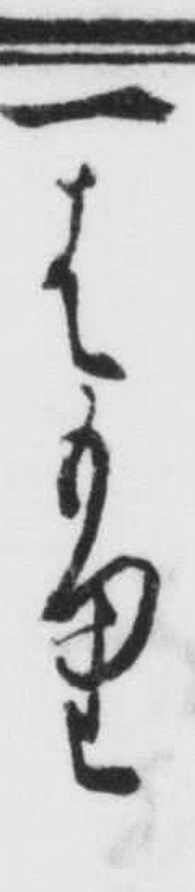一はもり
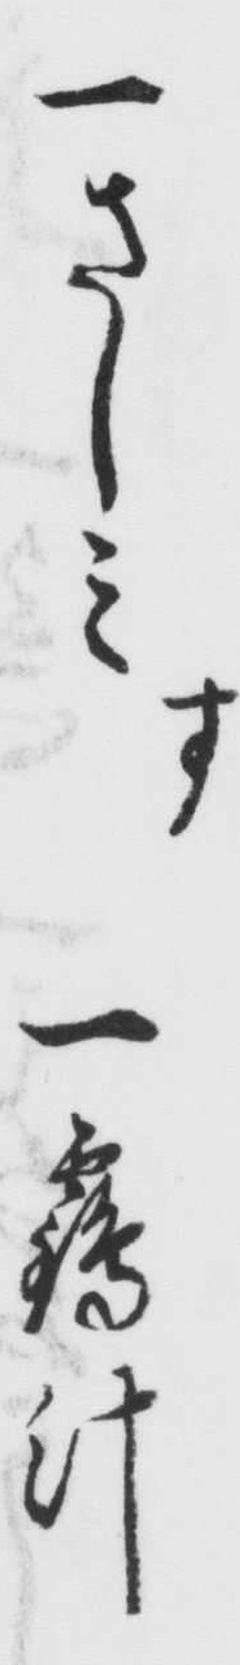一さしミ一鶴汁
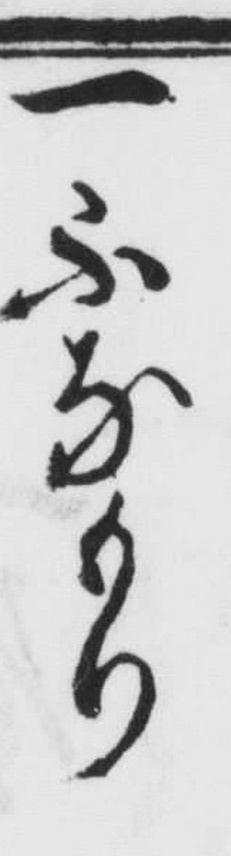一ふなもり
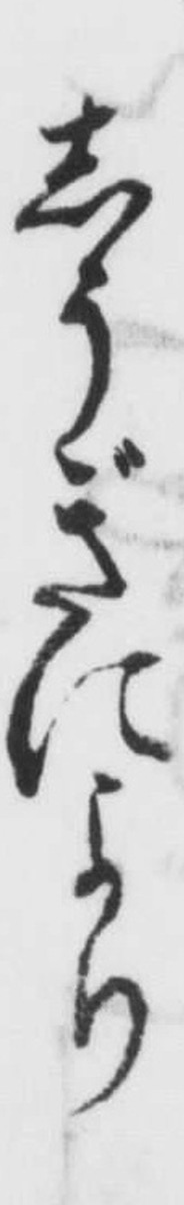しうぎにより
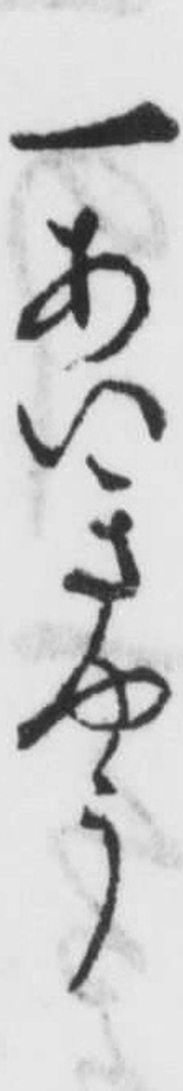一あいきやう
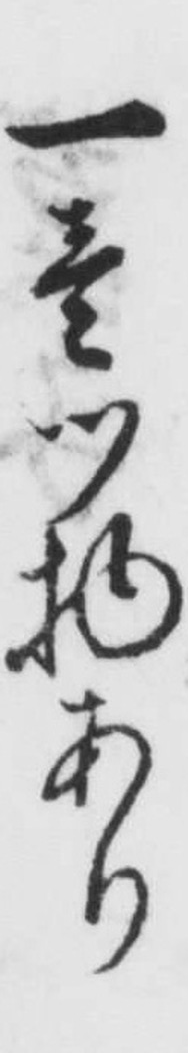一重ツ物あり

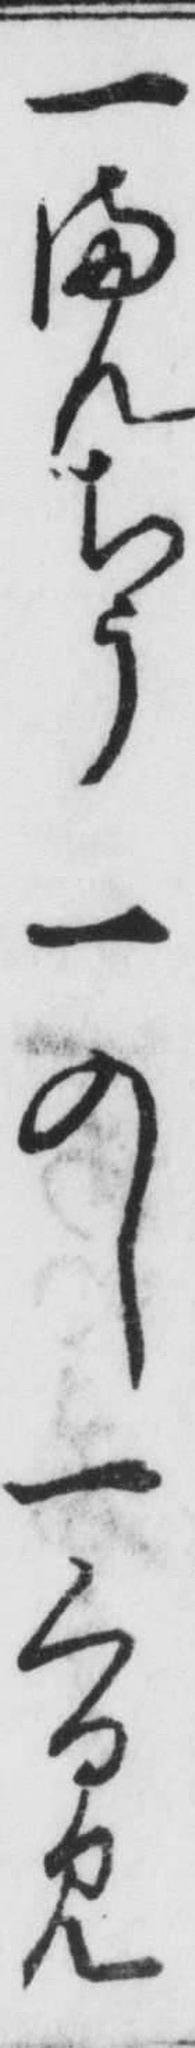一まんちう一のし一くるみ
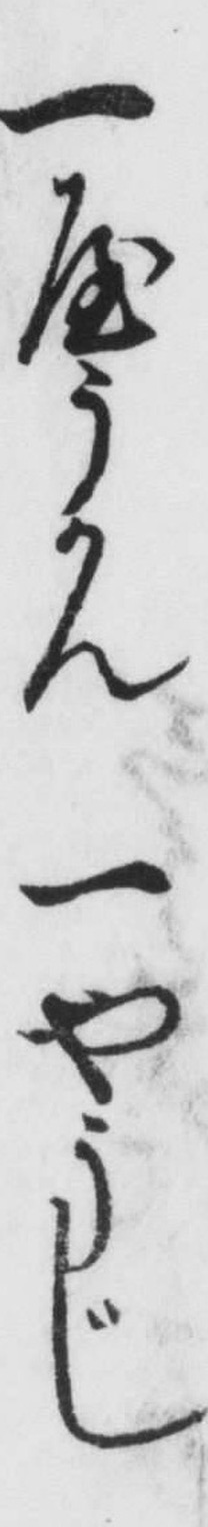一へうかん一やうじ
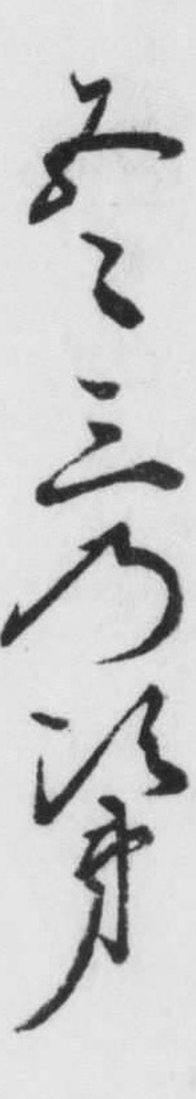五々三の次第
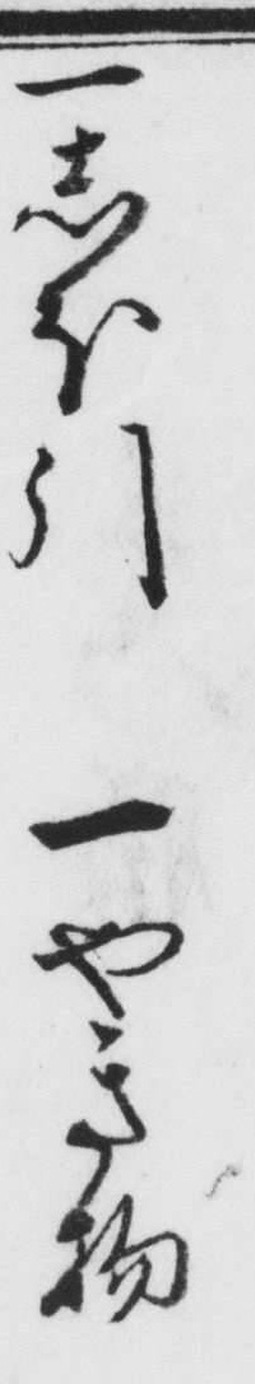一しほ引一やき物
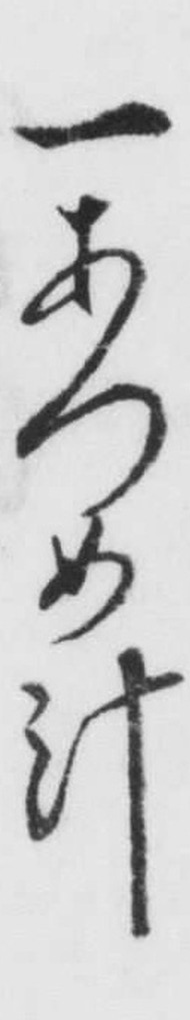一あつめ汁
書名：料理切形秘伝抄
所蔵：大阪府立大学学術情報センター 国文学研究資料館
